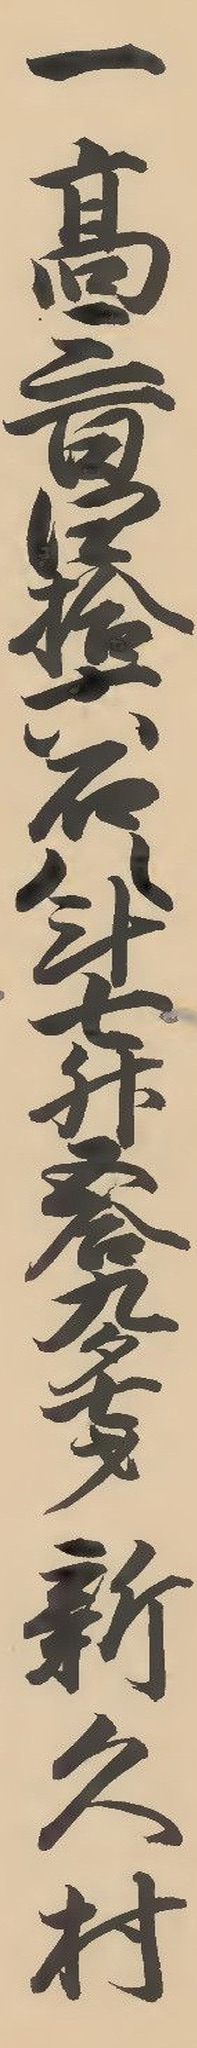一高三百四拾六石八斗七升五合九勺七才新久村
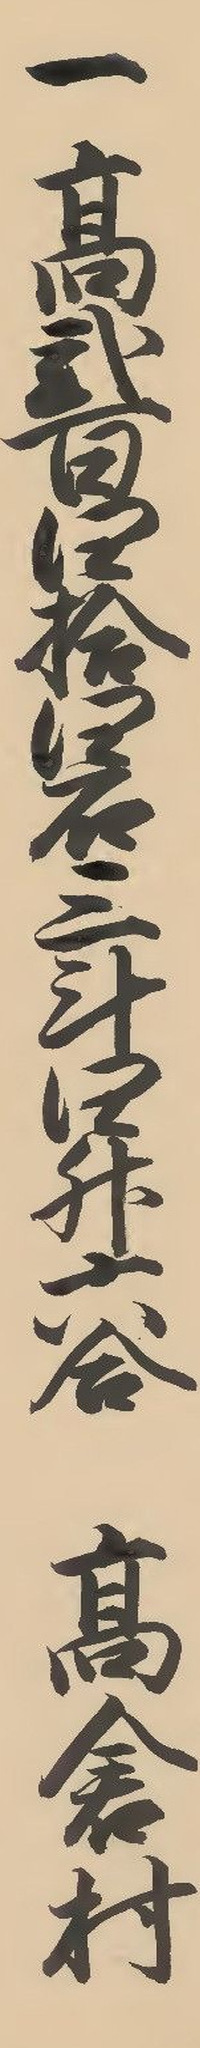一高弐百四拾四石三斗四升六合高倉村
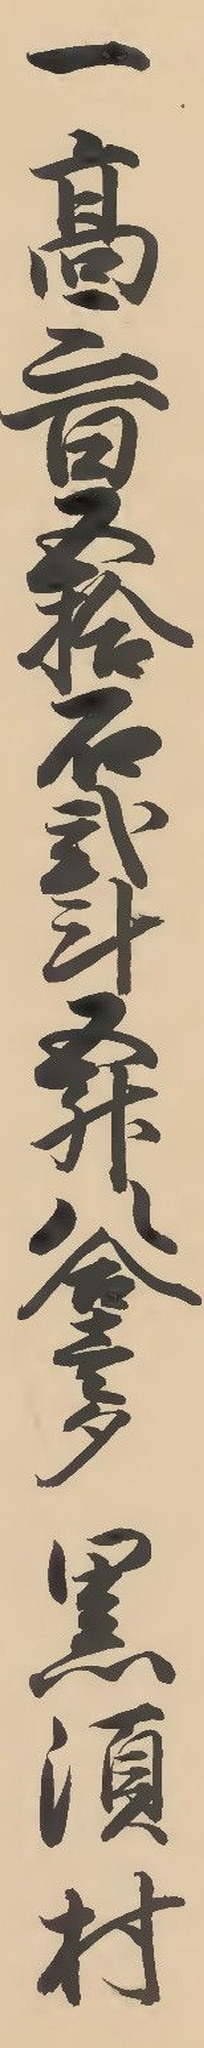一高三百五拾石弐斗五升八合壱勺黒須村
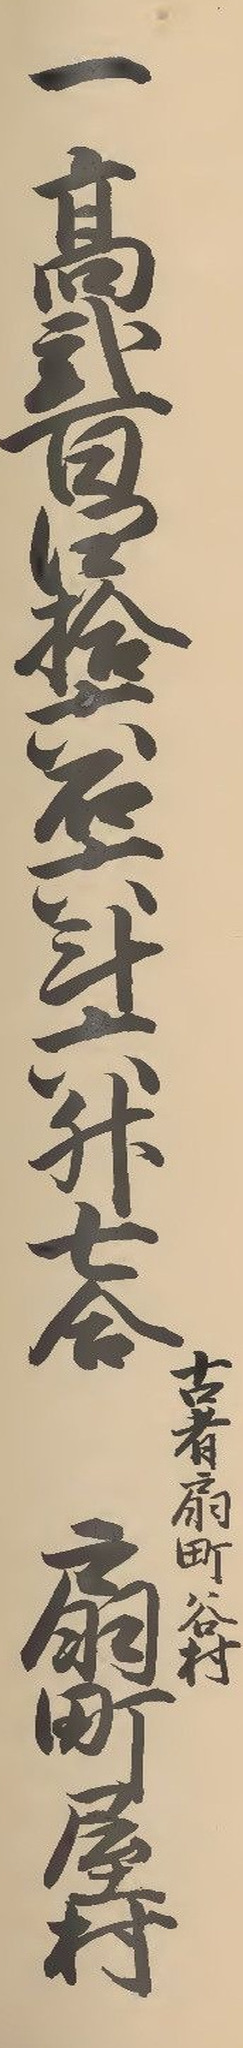一高弐百四拾六石六斗六升七合扇町屋村
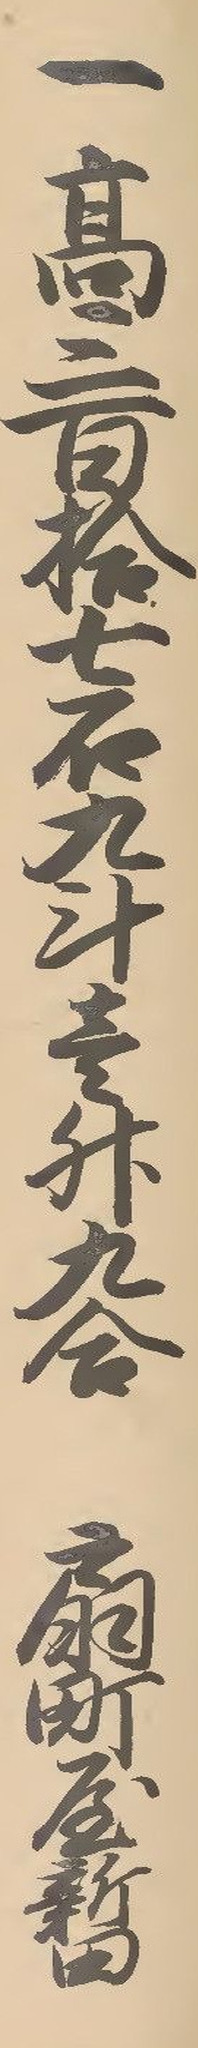一高三百拾七石九斗壱升九合扇町屋新田
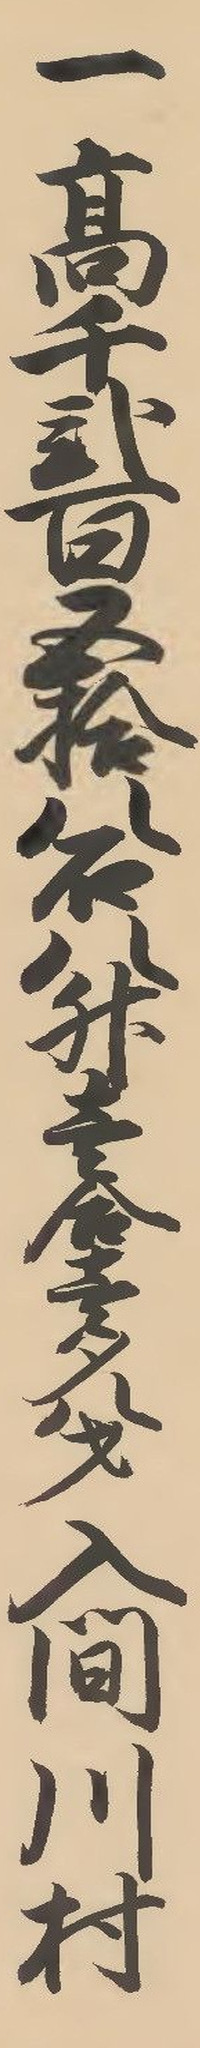一高千弐百五拾八石八升壱合壱勺八才入間川村
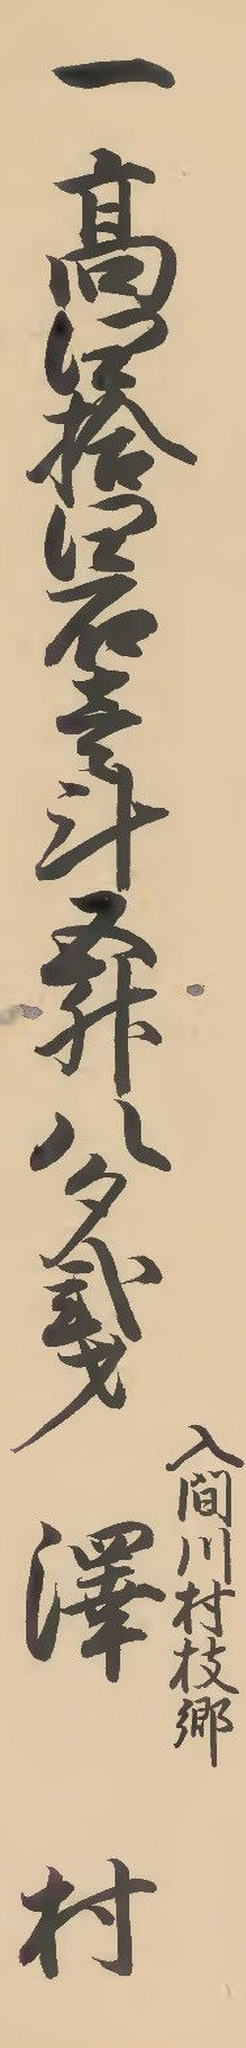一高四拾四石壱斗五升八勺弐才澤村

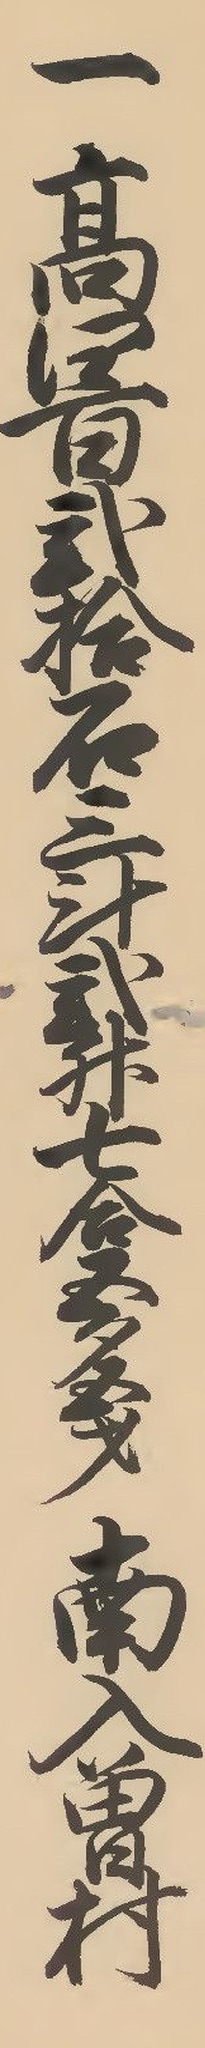一高四百弐拾石三斗弐升七合五勺五才南入曽村
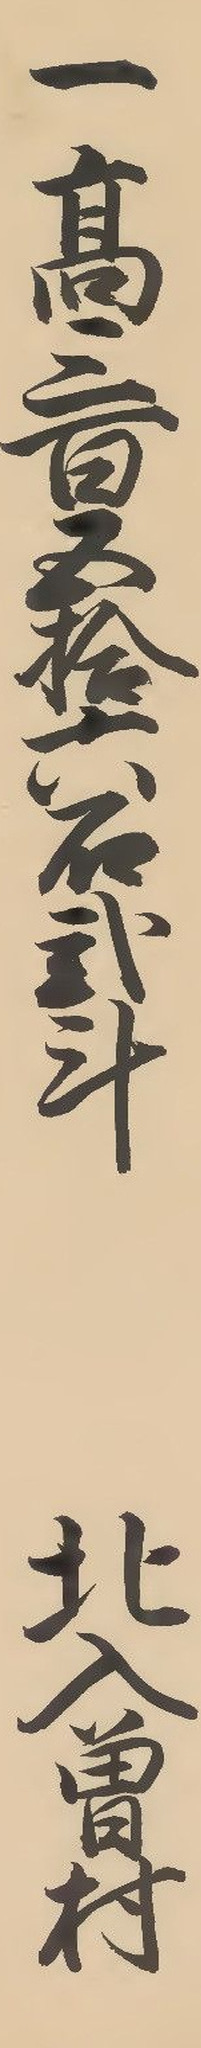一高三百五拾六石弐斗北入曽村
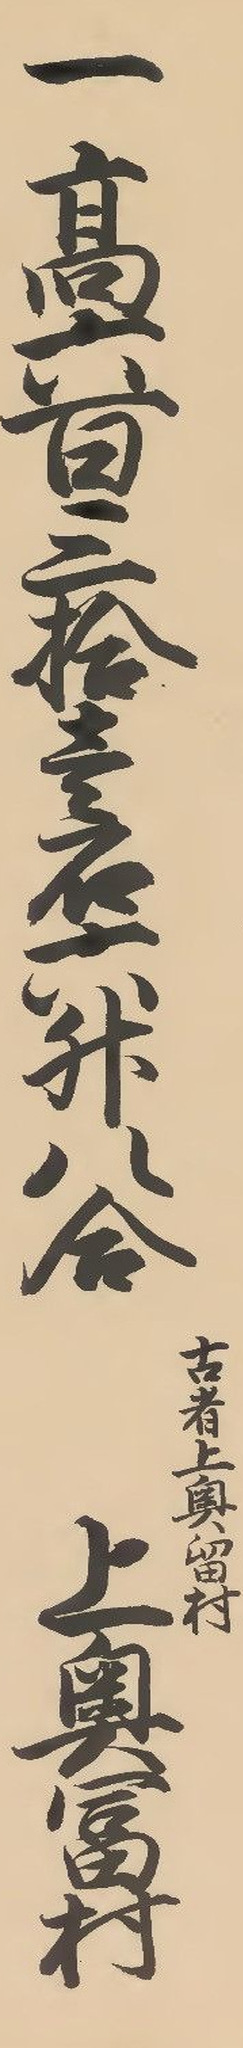一高六百三拾壱石六升八合上奥冨村
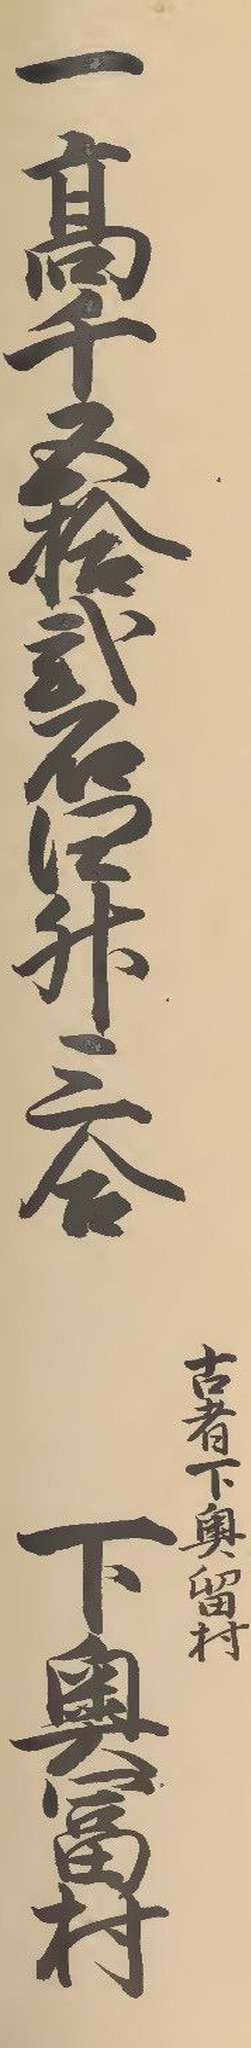一高千五拾弐石四升三合下奥冨村
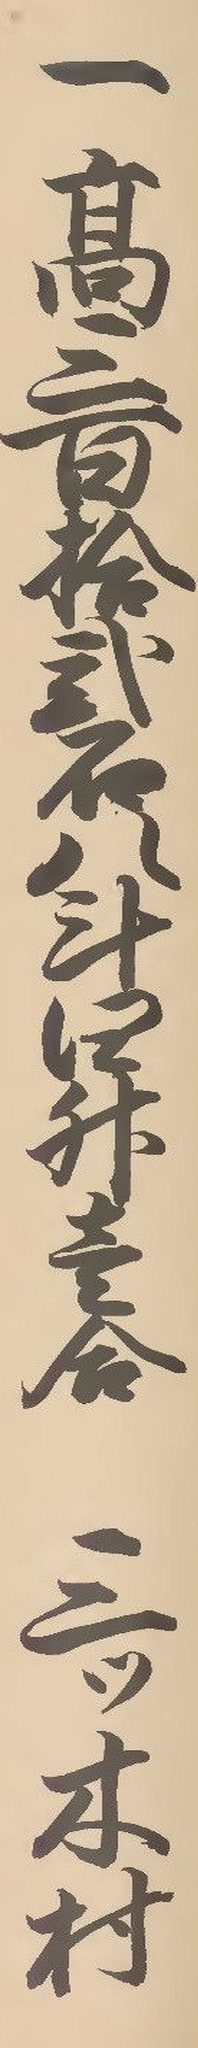一高三百拾弐石八斗四升壱合三ッ木村
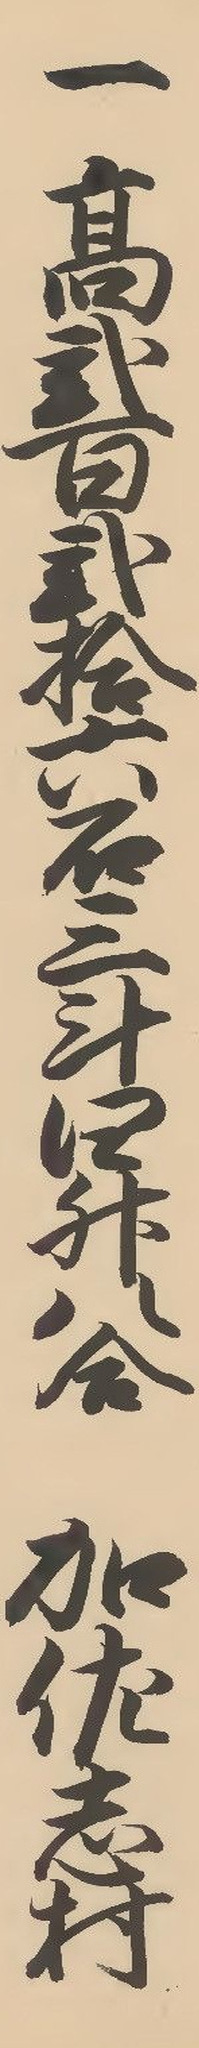一高弐百弐拾六石三斗四升八合加佐志村
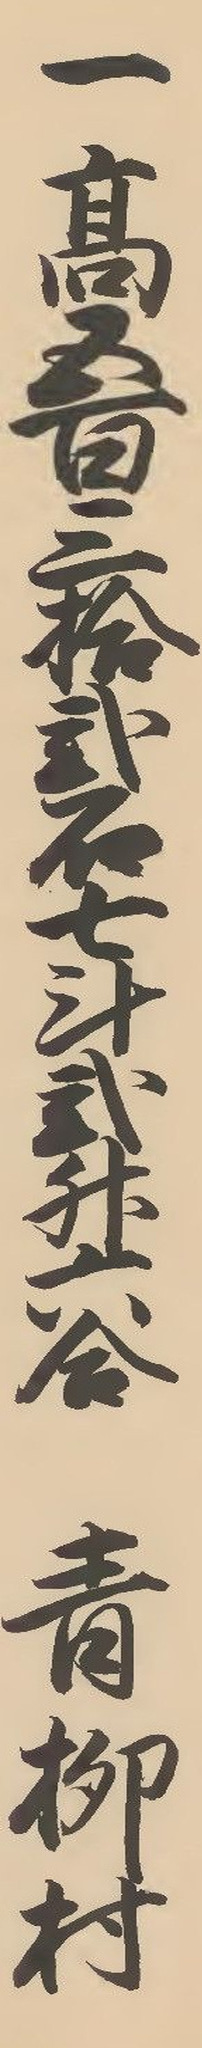一高五百三拾弐石七斗弐升六合青柳村
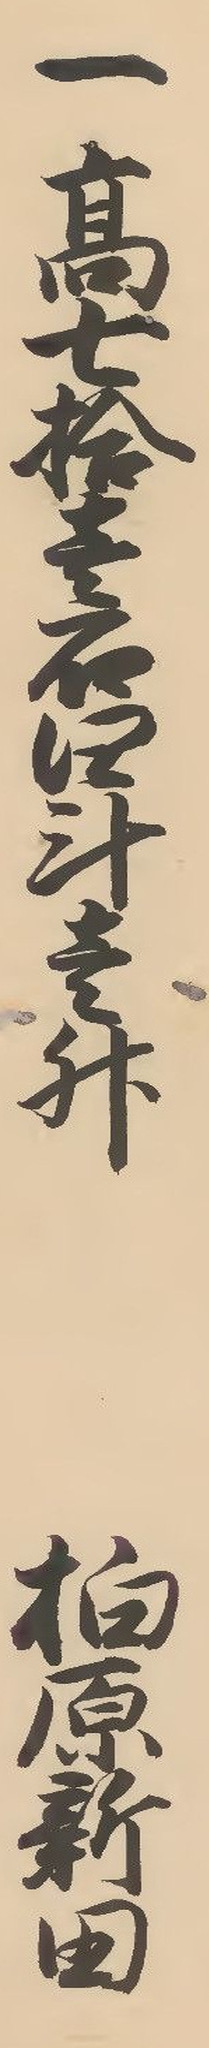一高七拾壱石四斗壱升柏原新田

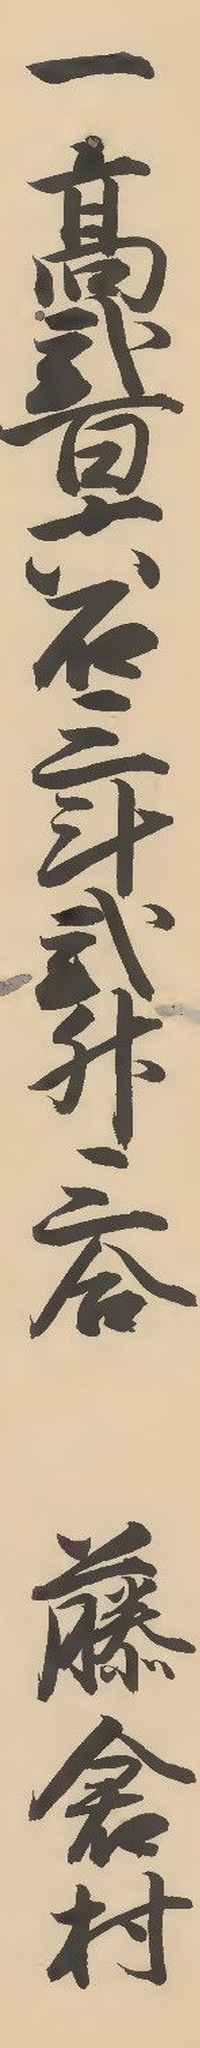一高弐百六石三斗弐升三合藤倉村
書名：武蔵国郷帳　上
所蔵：国立公文書館 National Archives of Japan
